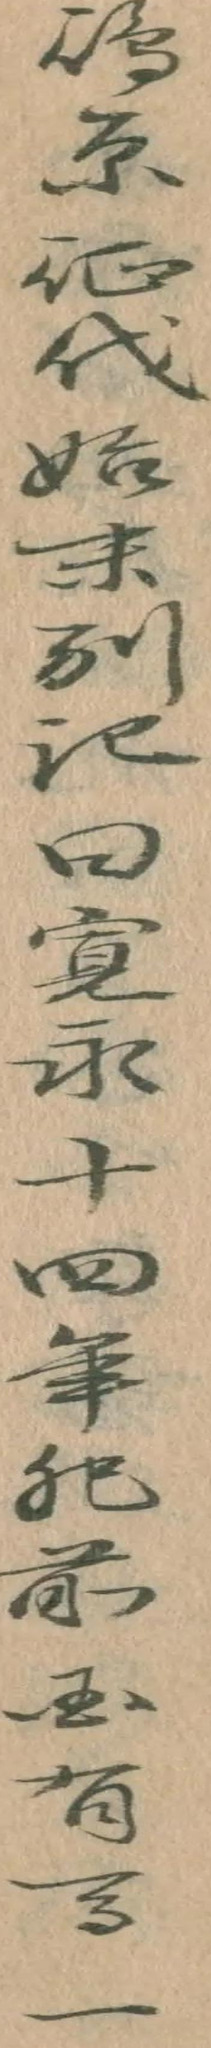島原征伐始末別記曰寛永十四年肥前国有馬一
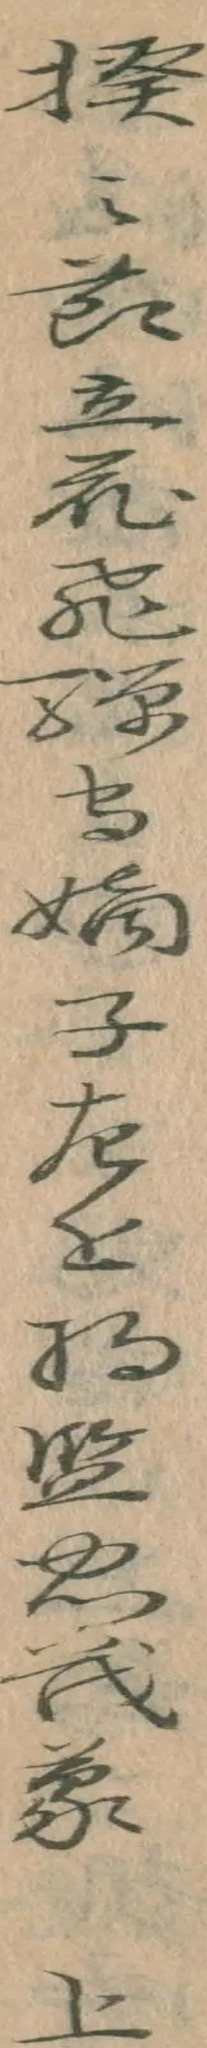揆之節立花飛騨守嫡子左近将監忠茂蒙上
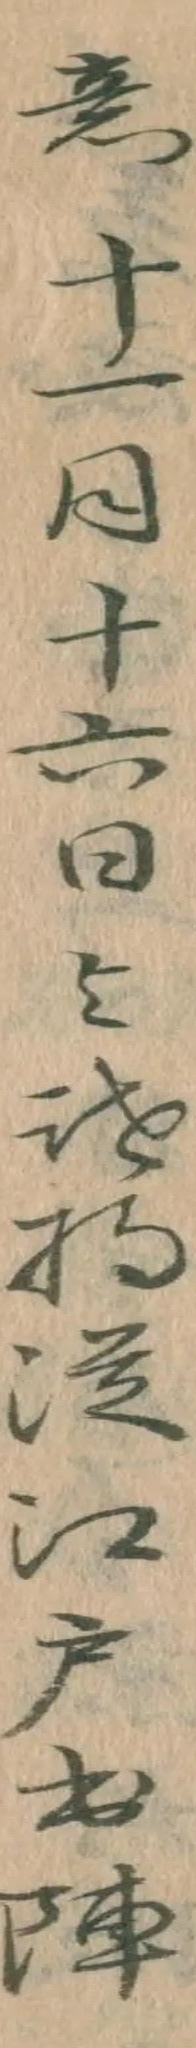意十一月十六日と諸将従江戸出陣
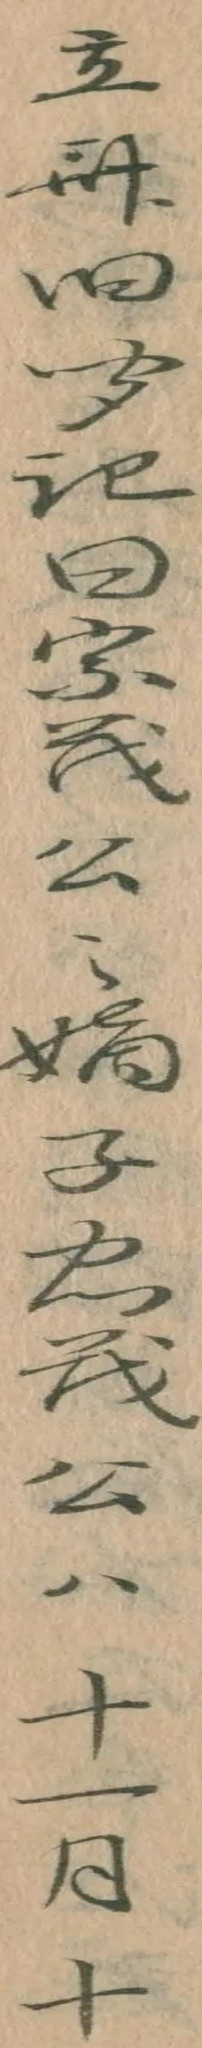立斎旧聞記曰宗茂公之嫡子忠茂公は十一月十
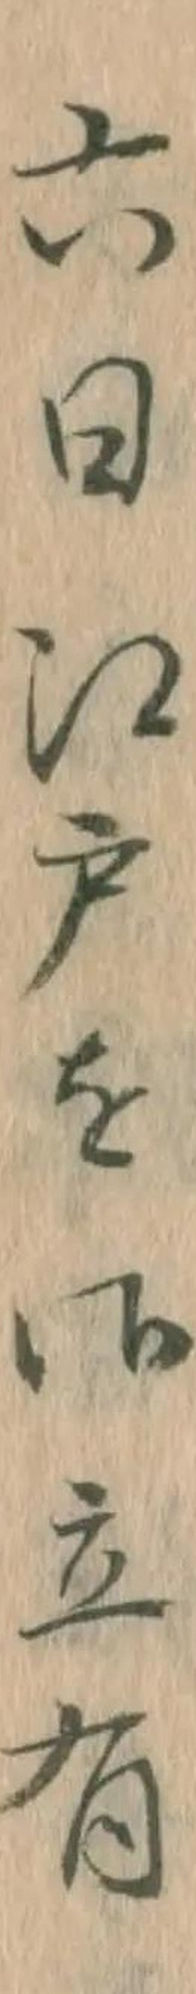六日江戸を御立有
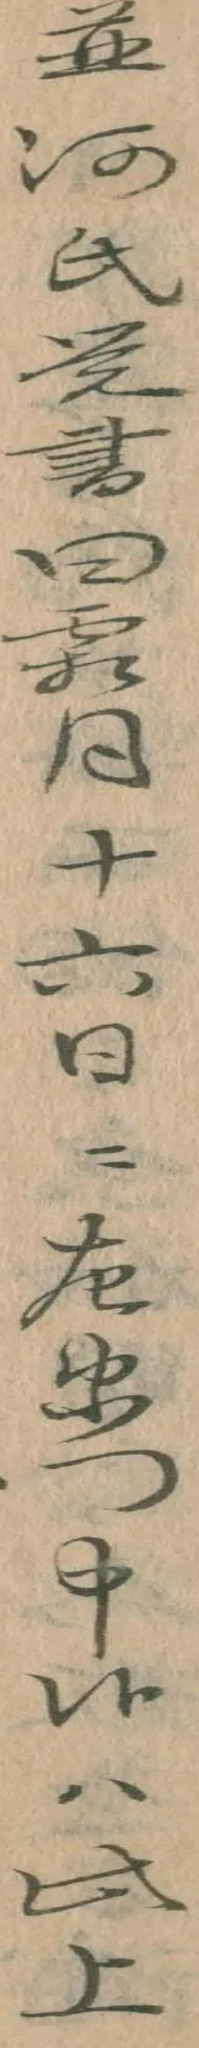並河氏覚書曰霜月十六日に左衛門申候は此上
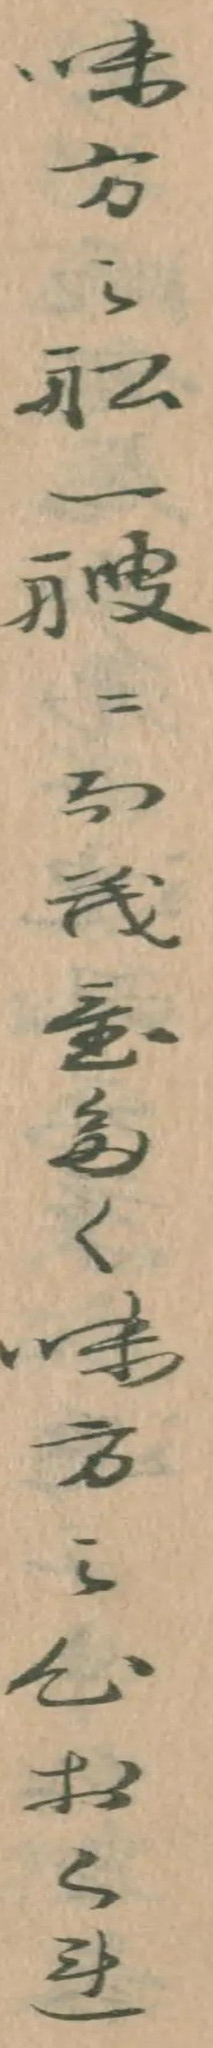味方之船一艘に而も置たく味方之心おくれ
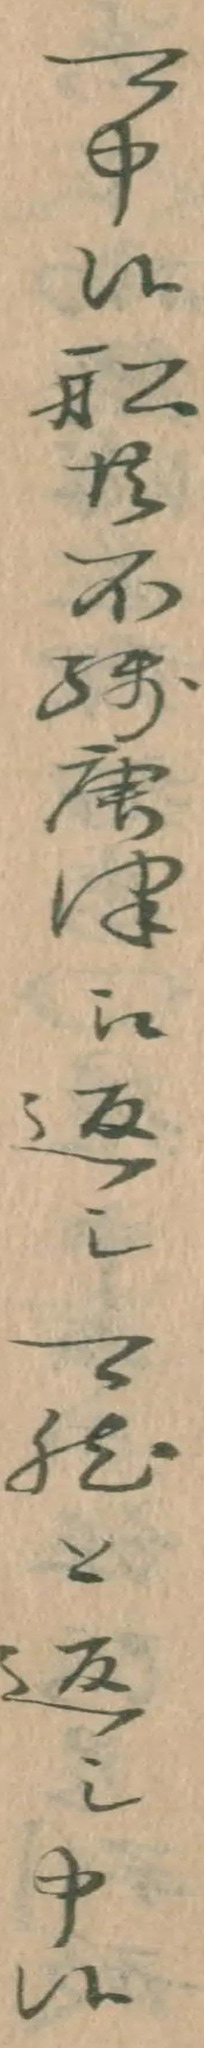可申候船共不残唐津江返シ可然と返シ申候
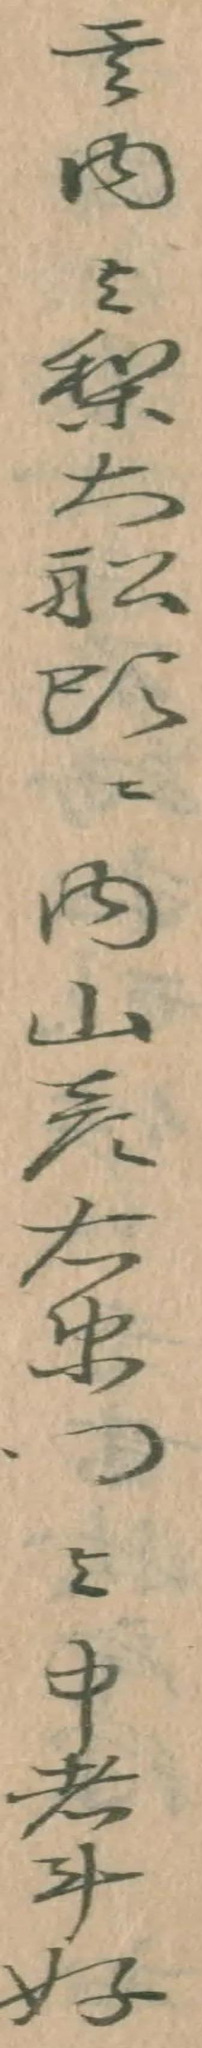其内より大船頭に内山彦右衛門と申者斗好
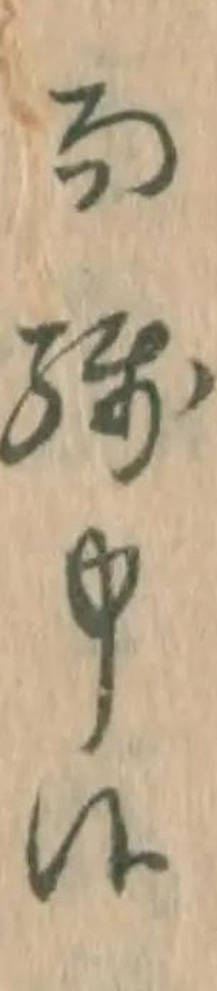而残申候
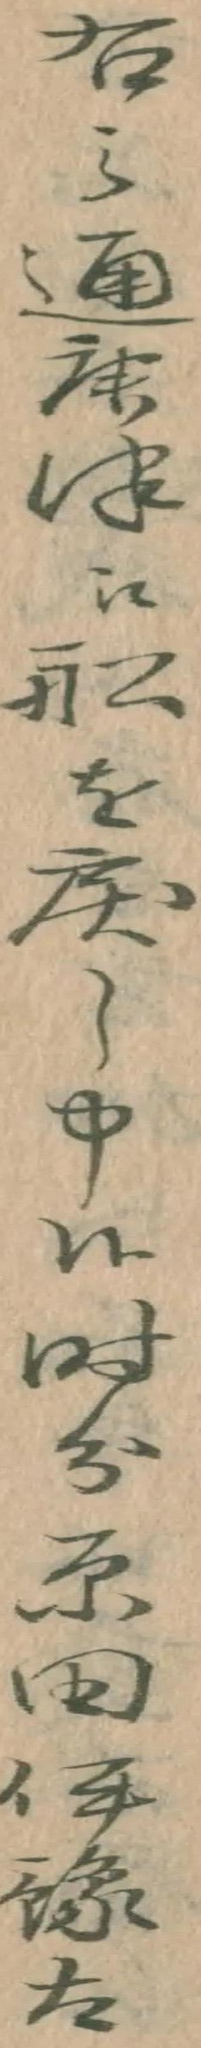右之通唐津江船を戻し申候時分原田伊予太
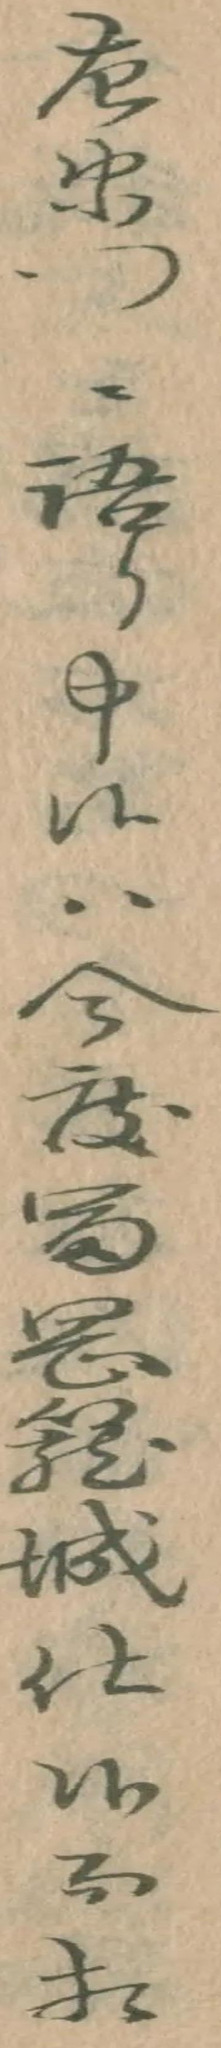左衛門に語り申候は今度富岡籠城仕候而相
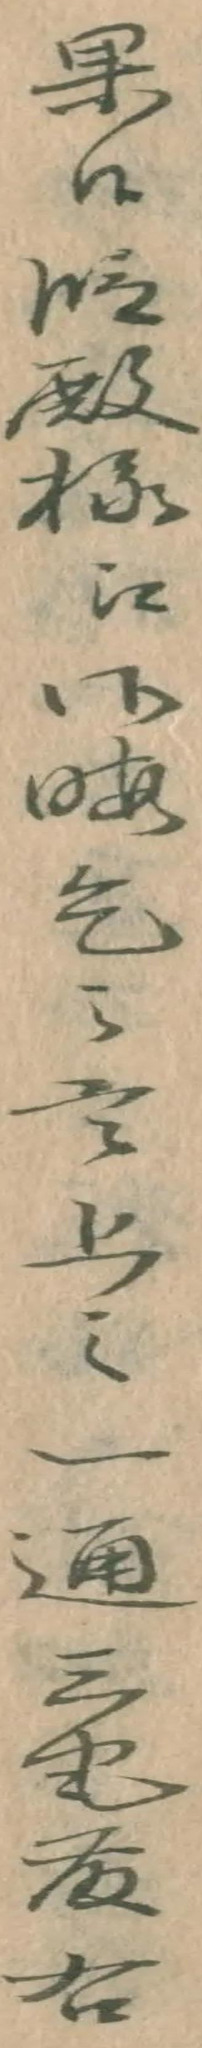果候段殿様江御暇乞之言上之一通三宅藤右
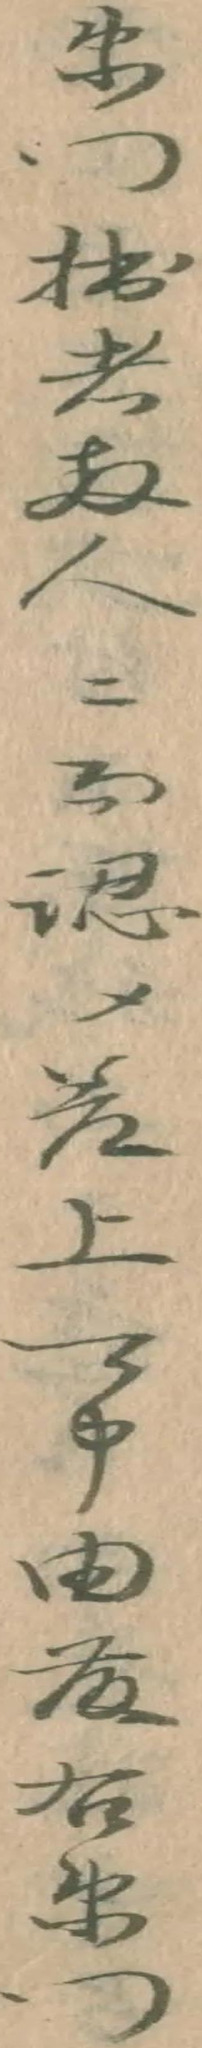衛門拙者両人に而認メ差上可申由藤右衛門
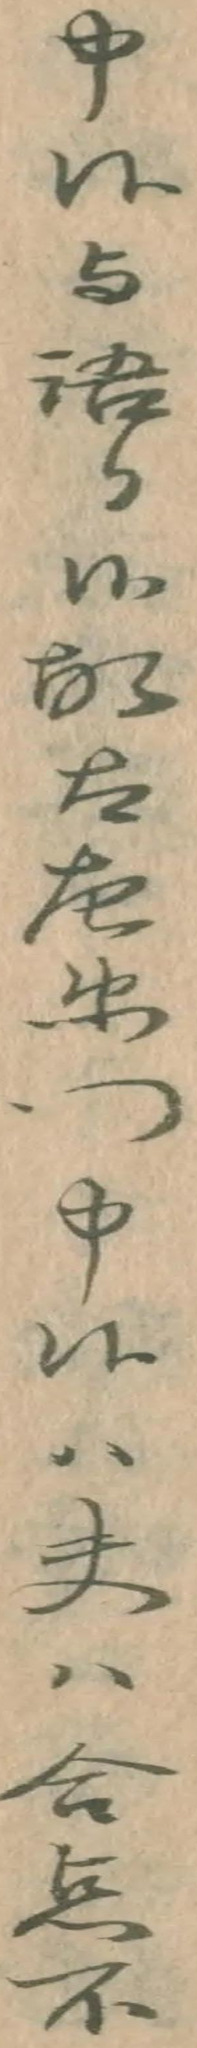申候と語り候故太左衛門申候は夫は合点不
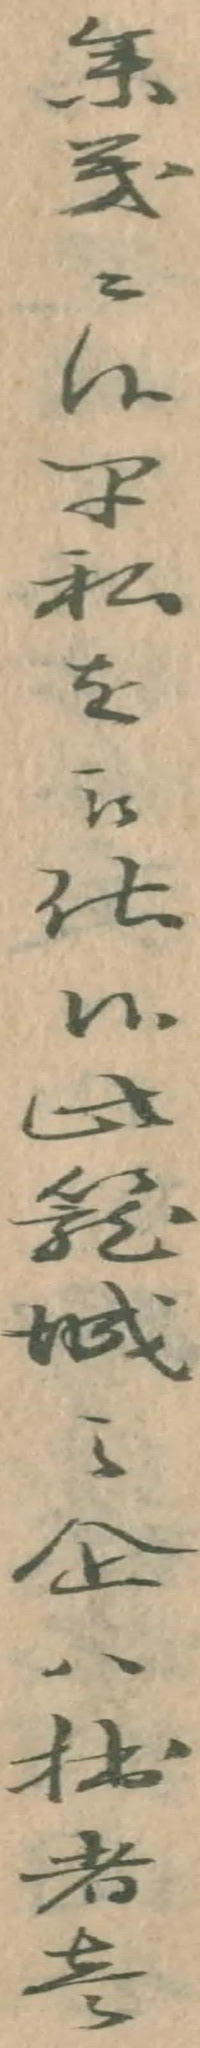参義に候早私を被仕候此籠城之企は拙者壱
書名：切支丹御退治記 49巻. [3]
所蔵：国立国会図書館 National Diet Library, JAPAN
